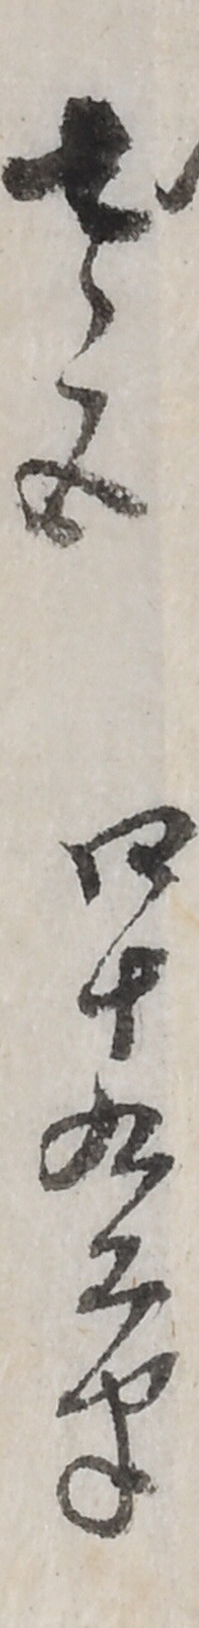七厘五四十九工半
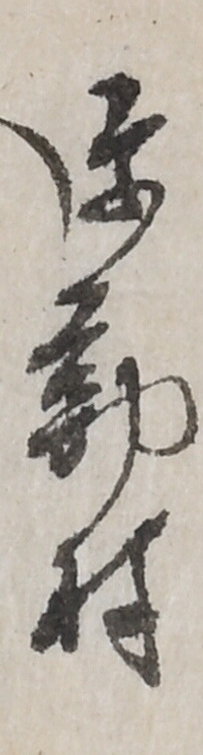弥勤村
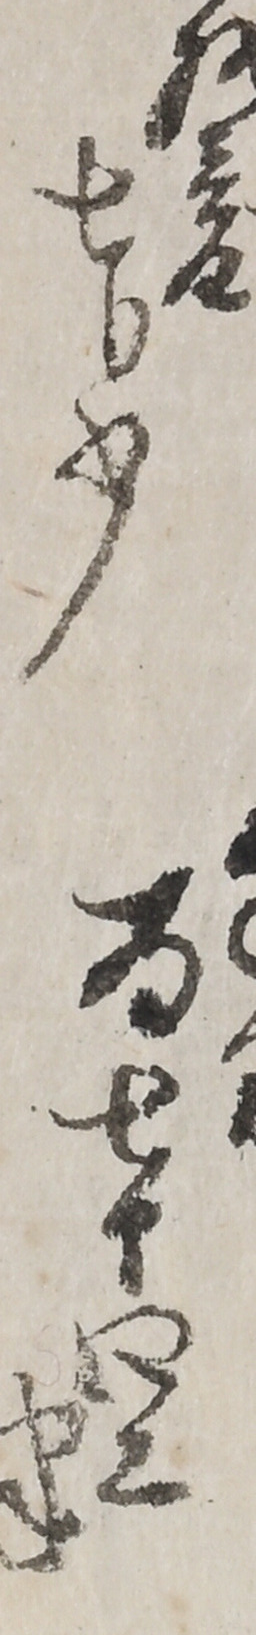七分五百七十四工半
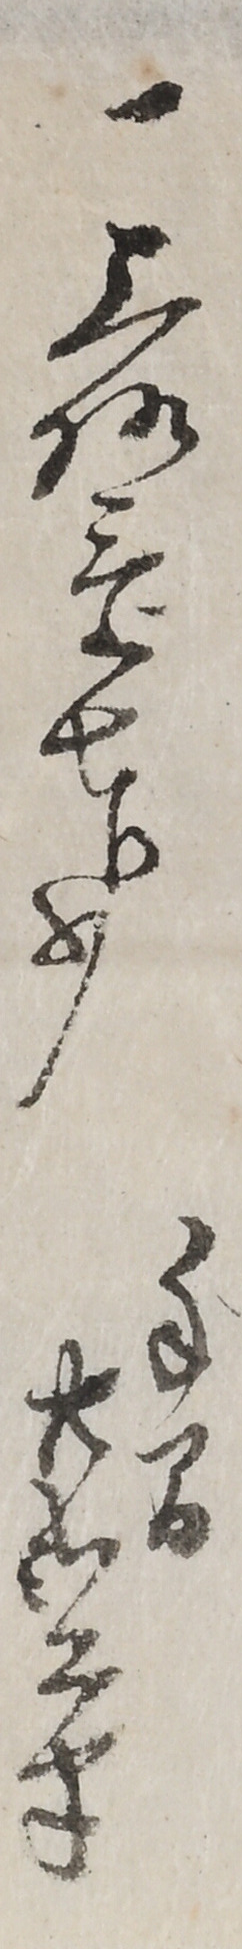一三拾三匁七分五手間
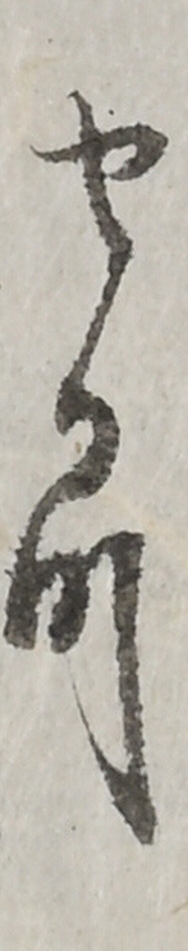せり町
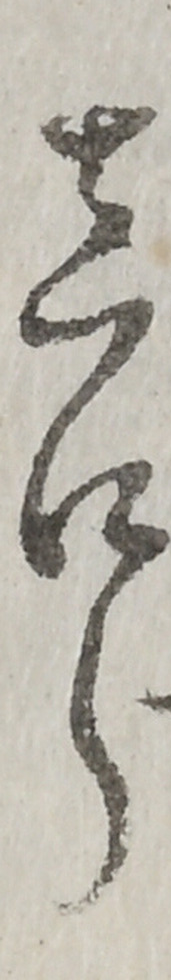志四郎

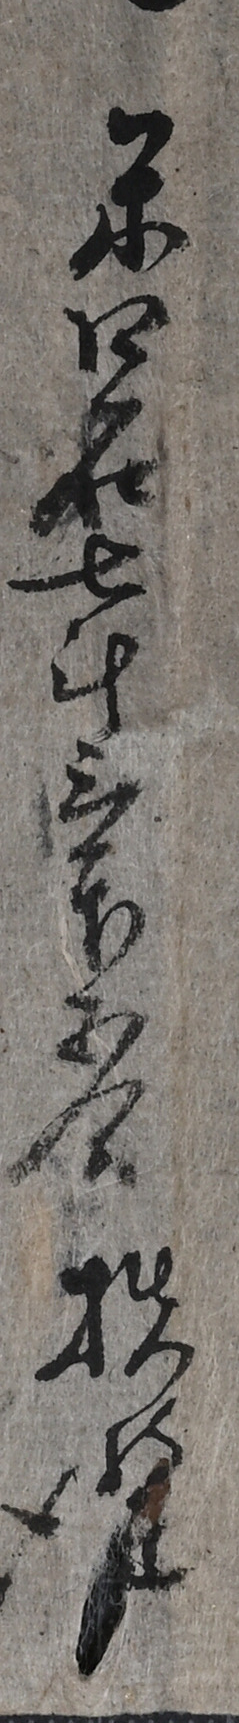一米四石七斗三升五合〆
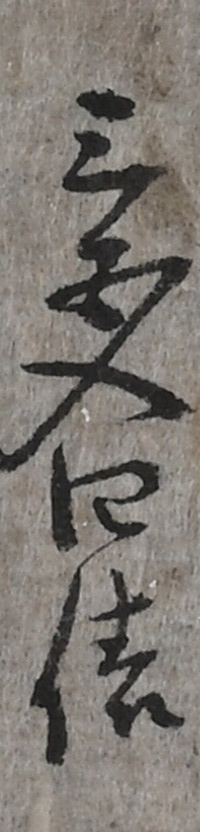三五入四俵
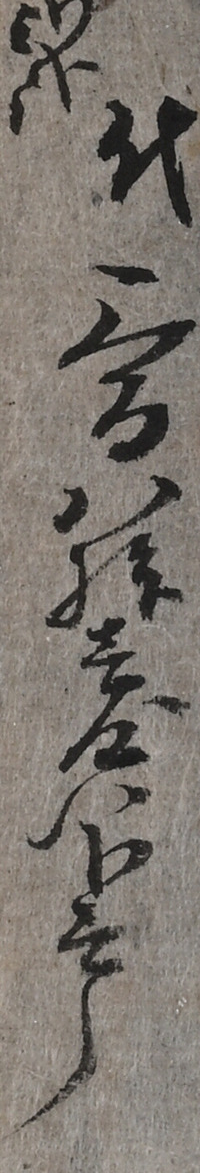代三百八拾壱匁八分六厘
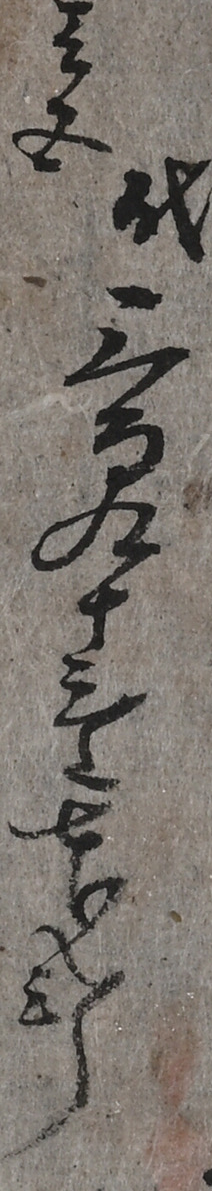代三百九十三匁七分弐厘
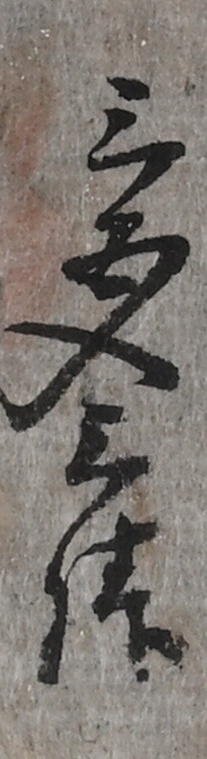三五入三俵
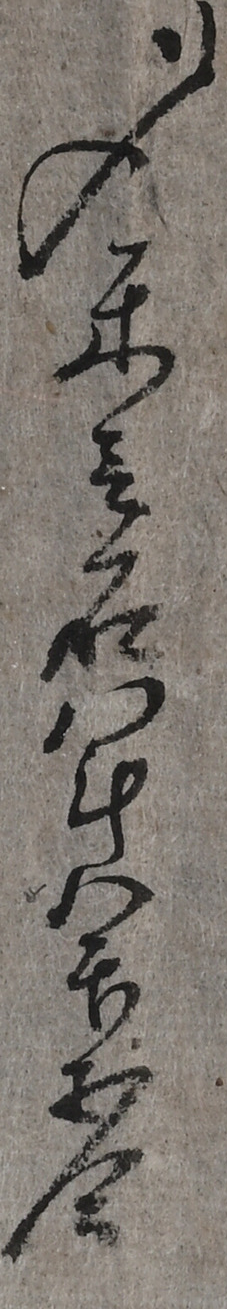同〆米壱石八斗八升五合
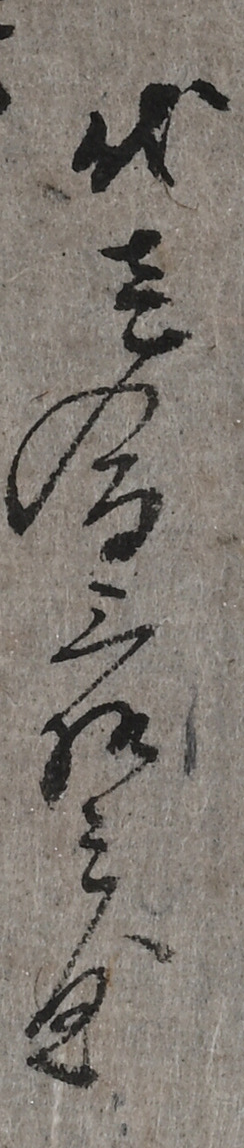代壱貫百三拾壱匁
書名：町方木戸御普請諸事附（一括）
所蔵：伊那市立高遠町図書館・合同会社AMANE
